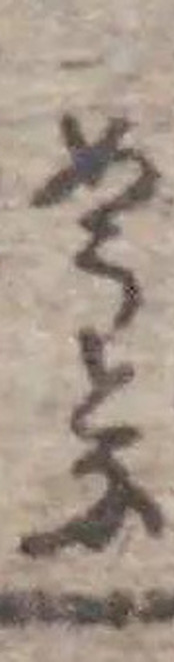めうとに
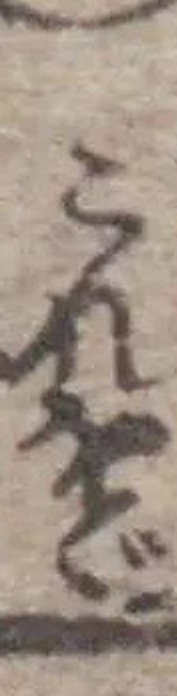これほど
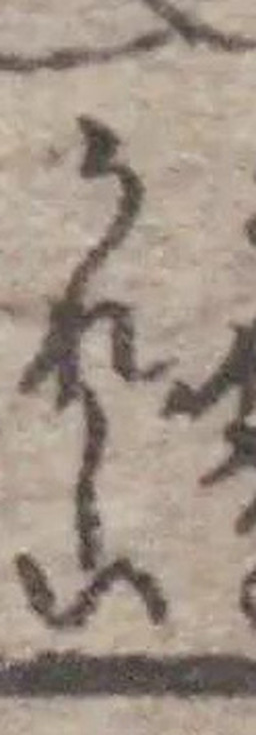うれしい
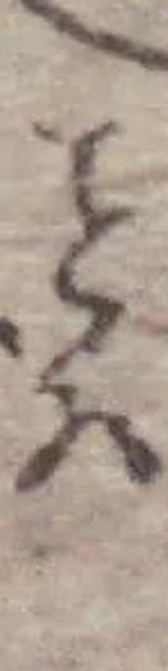ことは
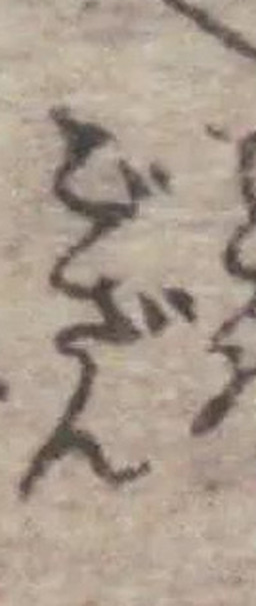ござん
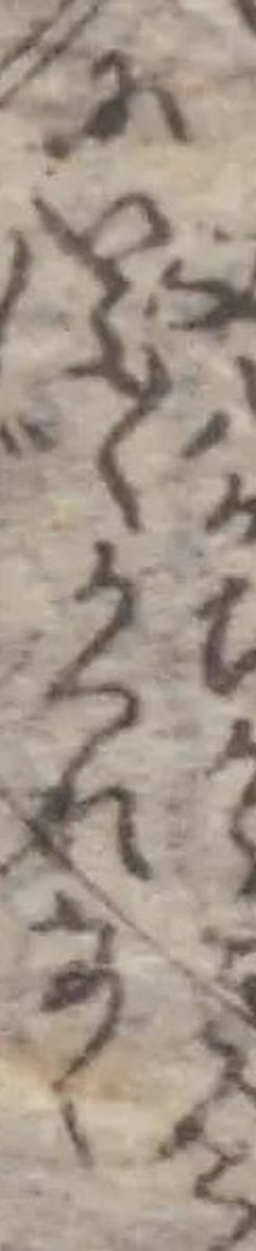にいよ〳〵かくれなく
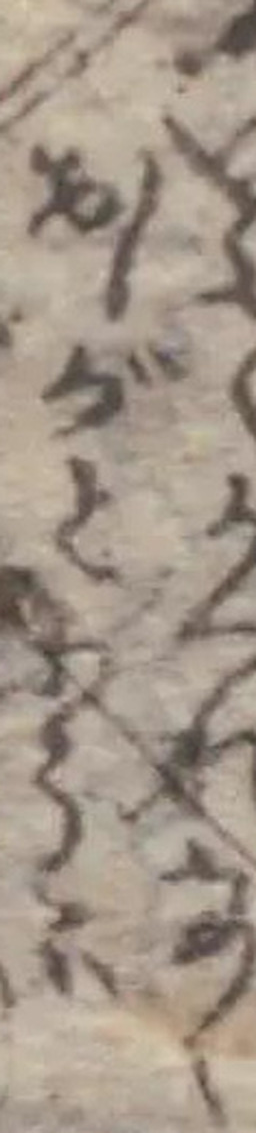おしがとふうふ
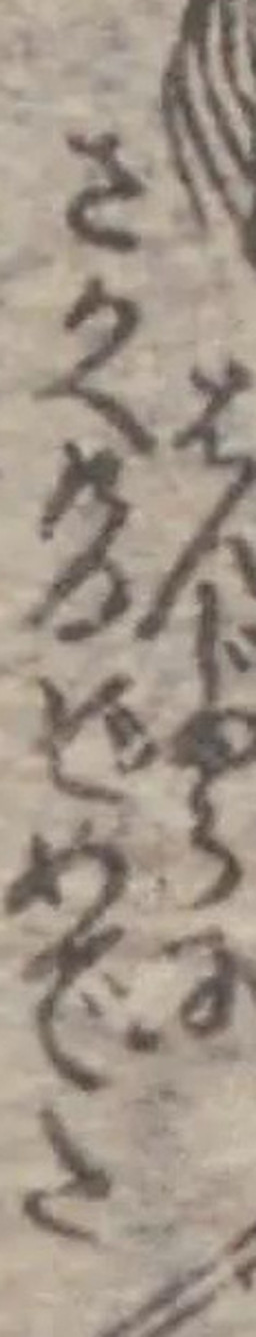さかへけるぞめでた
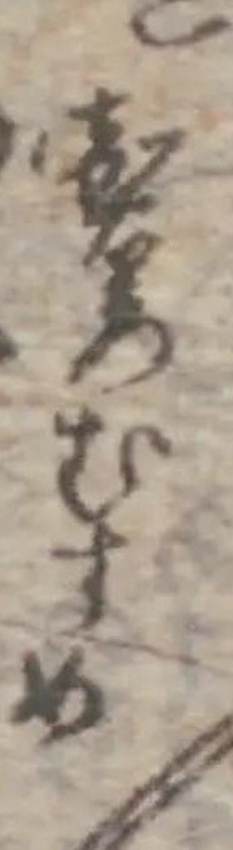嘉右衛門むすめ
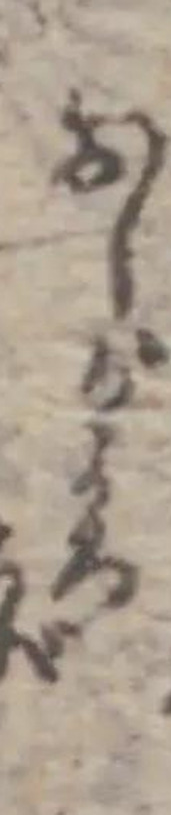おしがよろ
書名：鎌田又八 2巻
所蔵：国立国会図書館 National Diet Library, JAPAN
